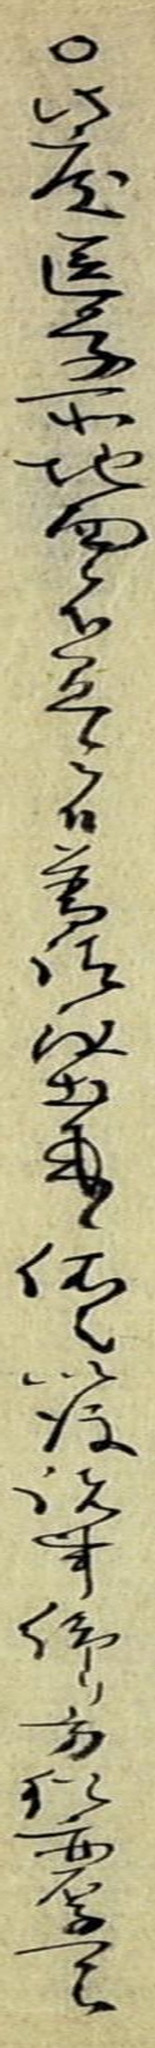○此度医学所地面被下置候に付普請致出来候依之以後諸事締り方猶亦厚可被
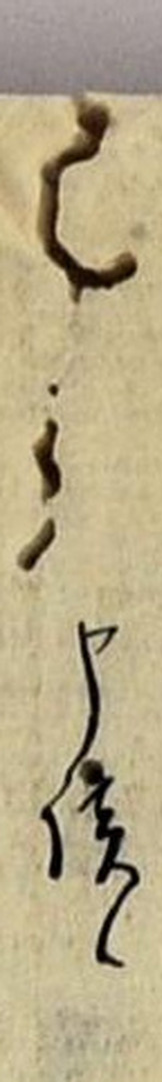申談候
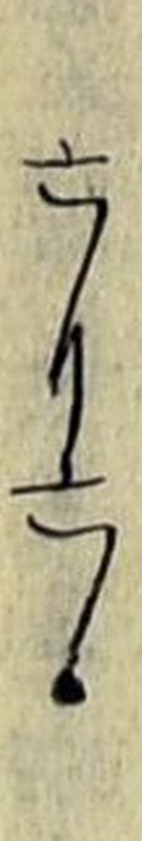六月六日
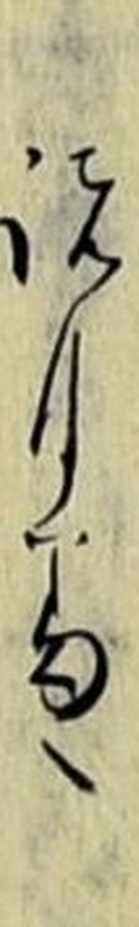諸月番へ
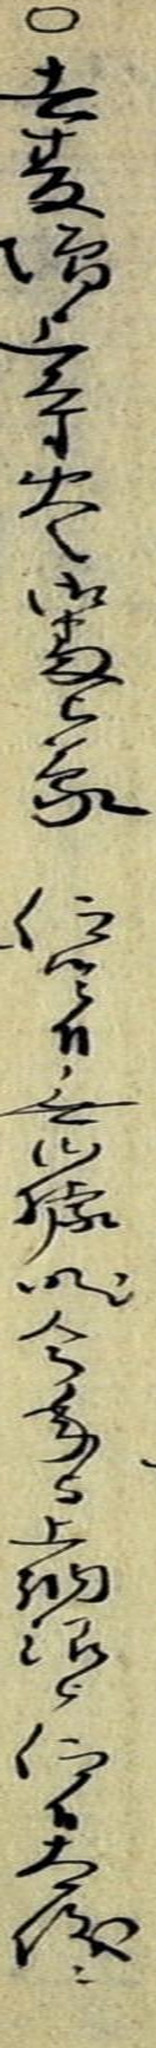○去夏増上寺火之御番被蒙仰候に付無御拠明今年と上納銀被仰付太儀に
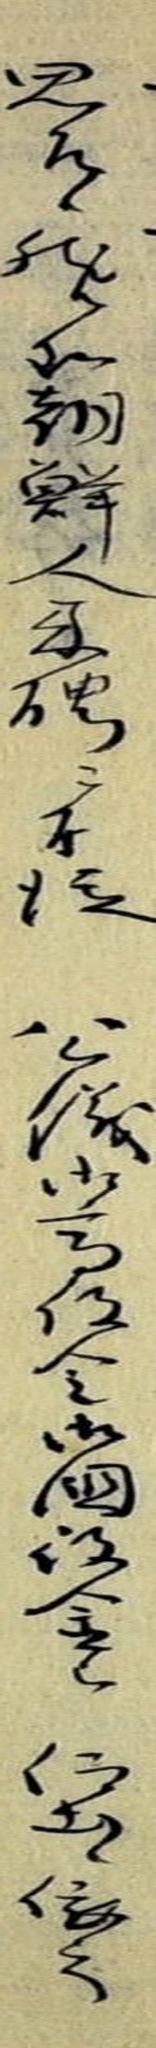思召候然ル処朝鮮人頼聘に付従公儀御高役金御国役金被仰出候依之
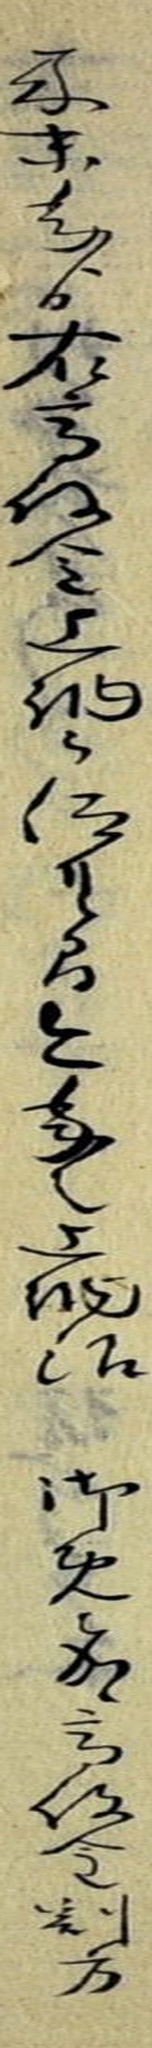來未年ゟ右高役金上納被仰付候間今年之上納銀御免被成候高役金割方
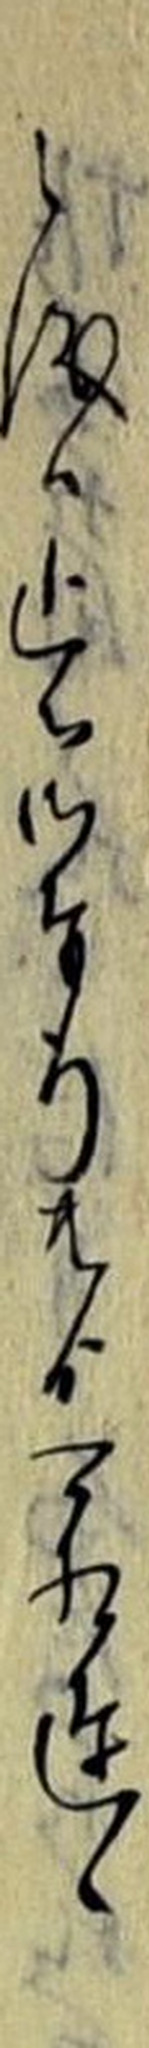之儀は追而御奉行共ゟ可相達候
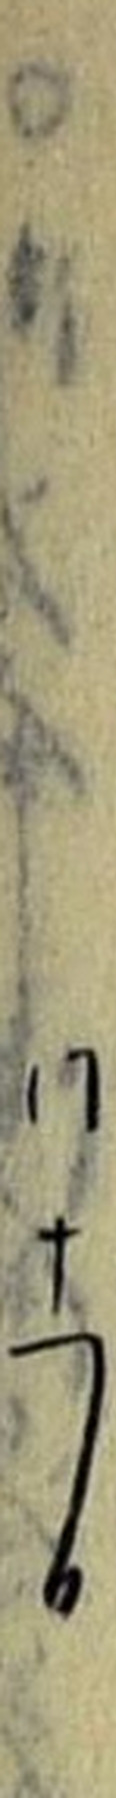同十一日
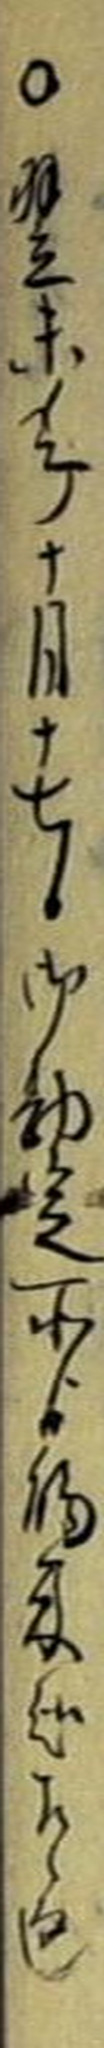○翌未年十月十七日御勘定所ゟ触来趣左之通
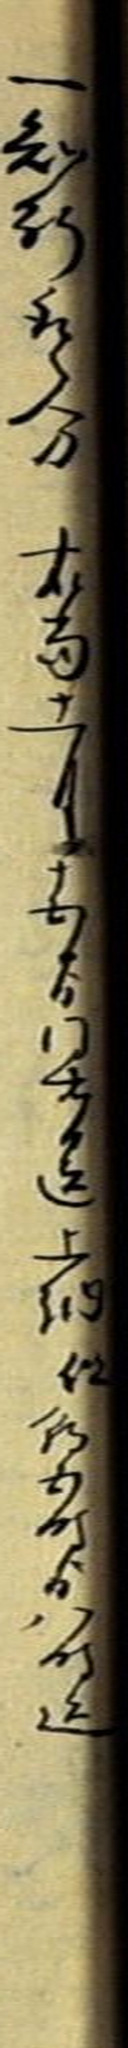一知行取之分右当十一月十五日ゟ同廿日迄上納但朝五時ゟ八時迄
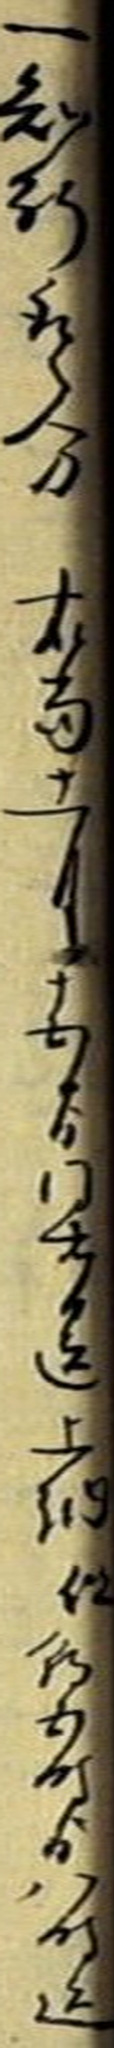一知行取之分右当十一月十五日ゟ同廿日迄上納但朝五時ゟ八時迄
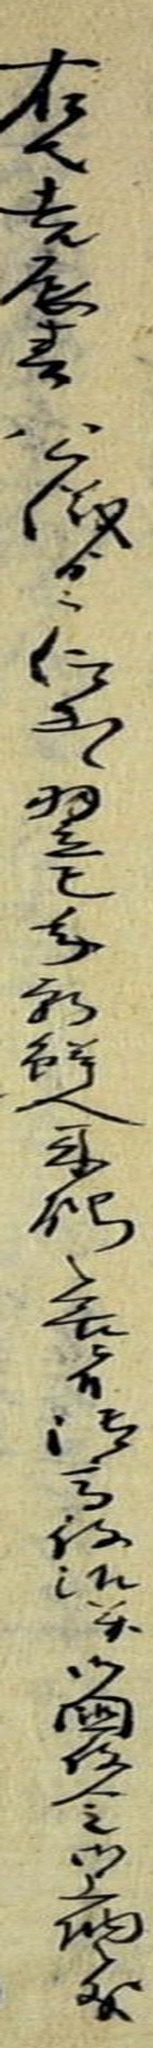右は去ル辰年春公儀ゟ被仰出候翌巳年朝鮮人來聘之節に付御高役銀并御国役金御上納之義
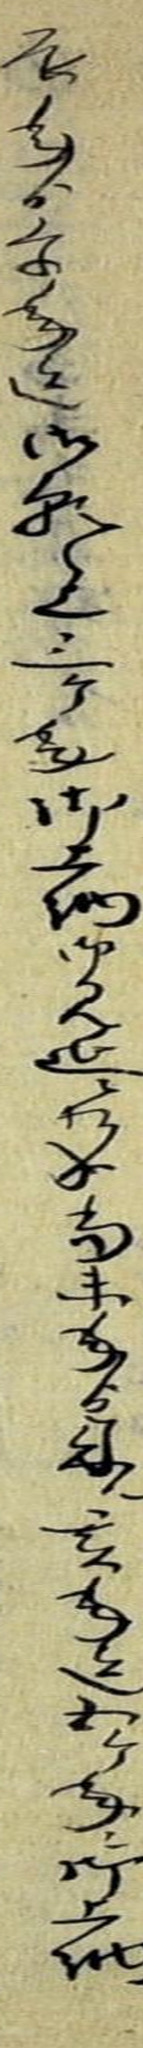辰年ゟ未年迄御願之上三ヶ年御上納御見延に相成当未年ゟ来ル亥年迄五ヶ年に御上納
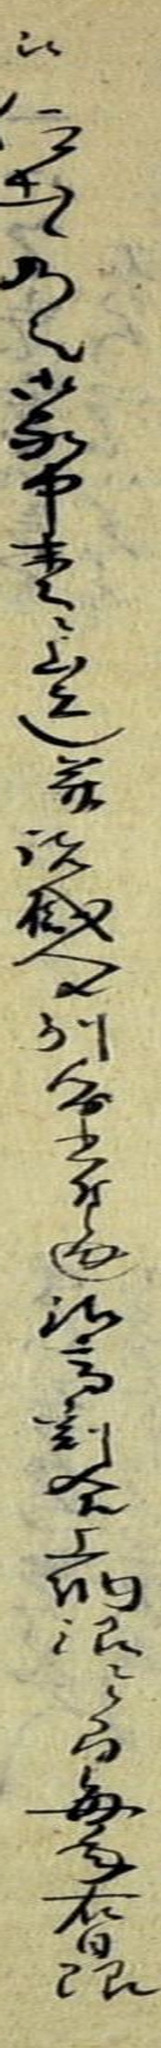被仰出候依之御家中末々に至迄并諸職人共別紙書付之通銀高割合上納銀に候間毎年右日限
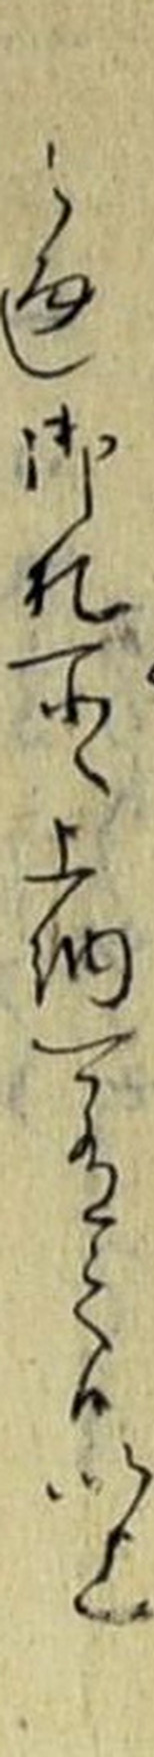之通御札所へ上納可有之候以上
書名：命令之部 四
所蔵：福井県文書館 Fukui Prefectural Archives
